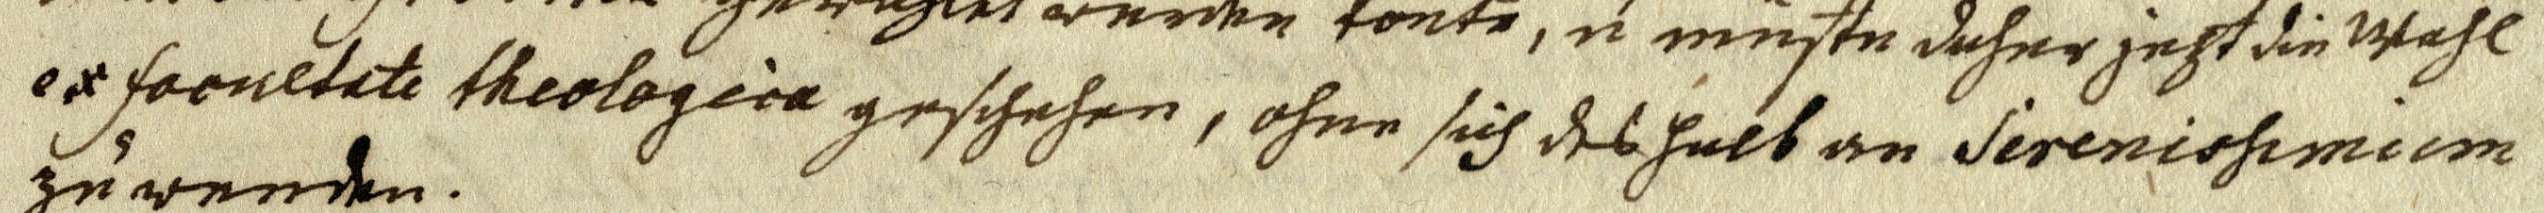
ex facultate theologica geschehen, ohne sich deshalb an Serenissimum
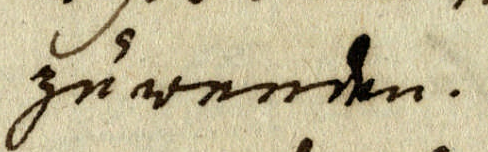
zu wenden.
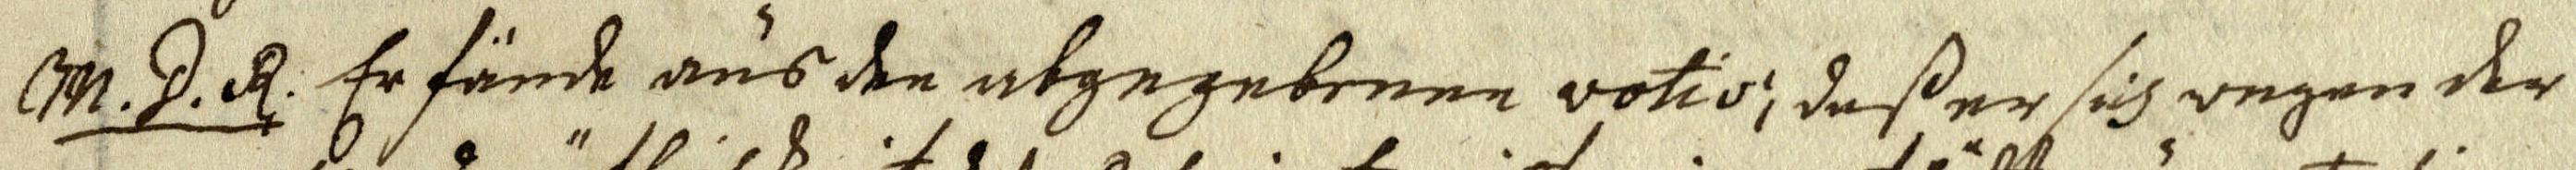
M. D. R. Er fände aus den abgegebenen votis, daß er sich wegen der
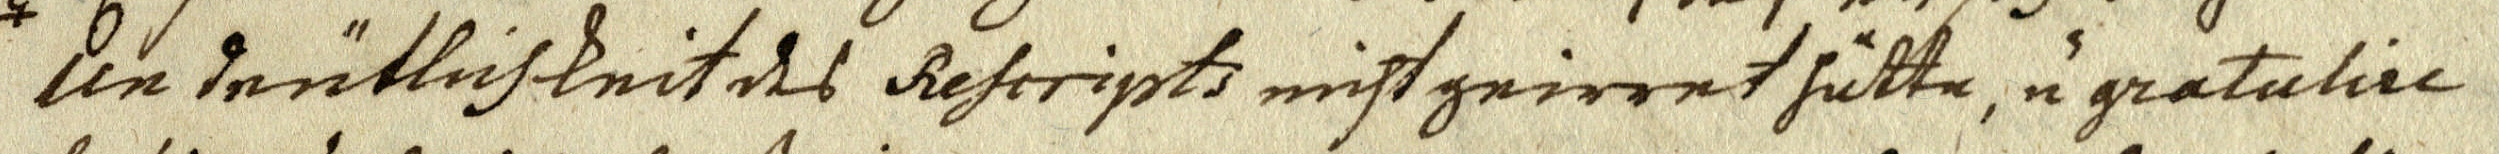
Undeutlichkeit des Rescripts nicht geirret hätte, u gratulire
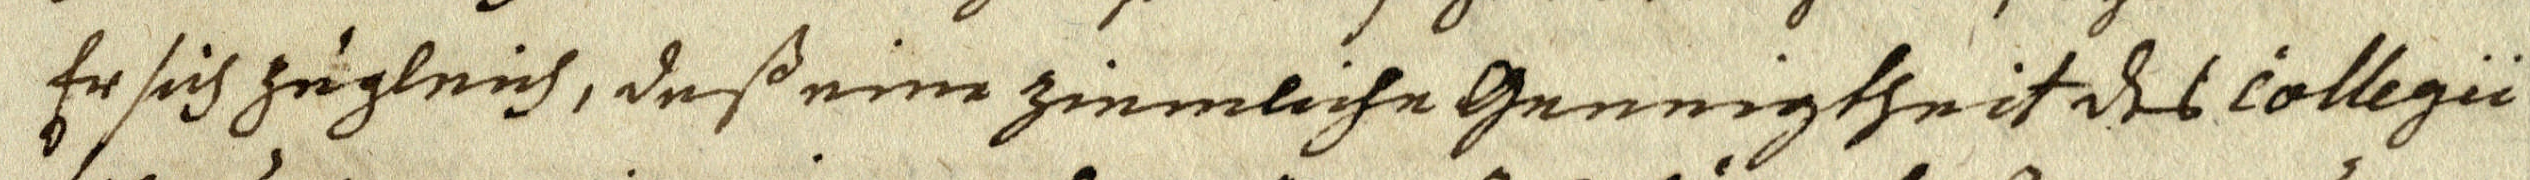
Er sich zugleich, daß eine ziemliche Geneigtheit des collegii
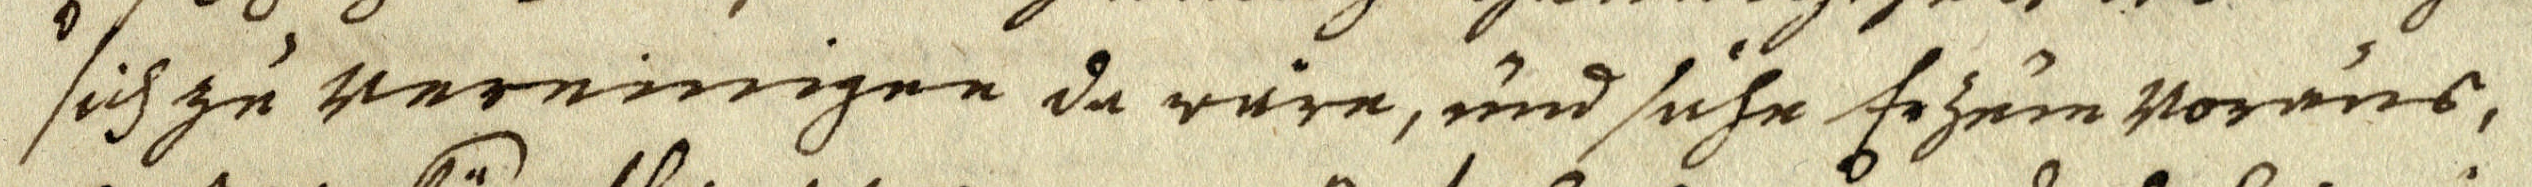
sich zu vereinigen da wäre, und sähe Er zum voraus,
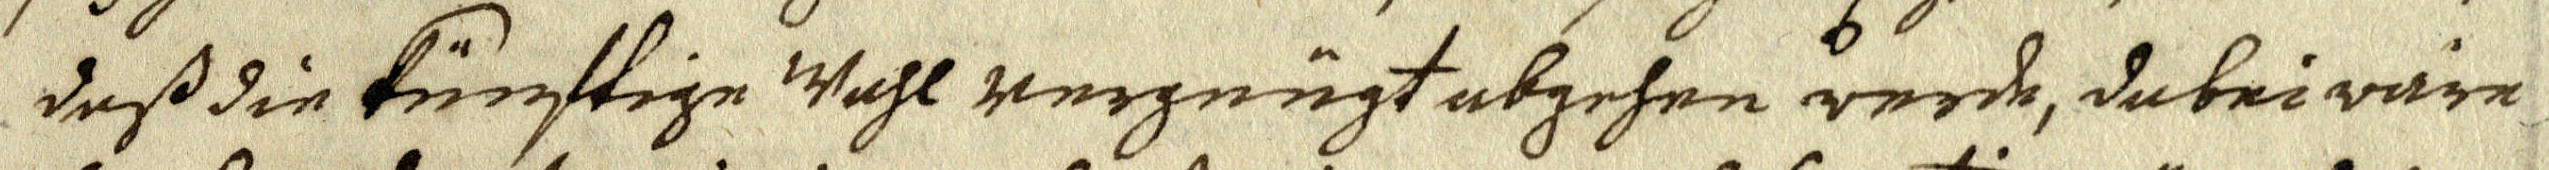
daß die künftige Wahl vergnügt abgehen werde, dabei wäre
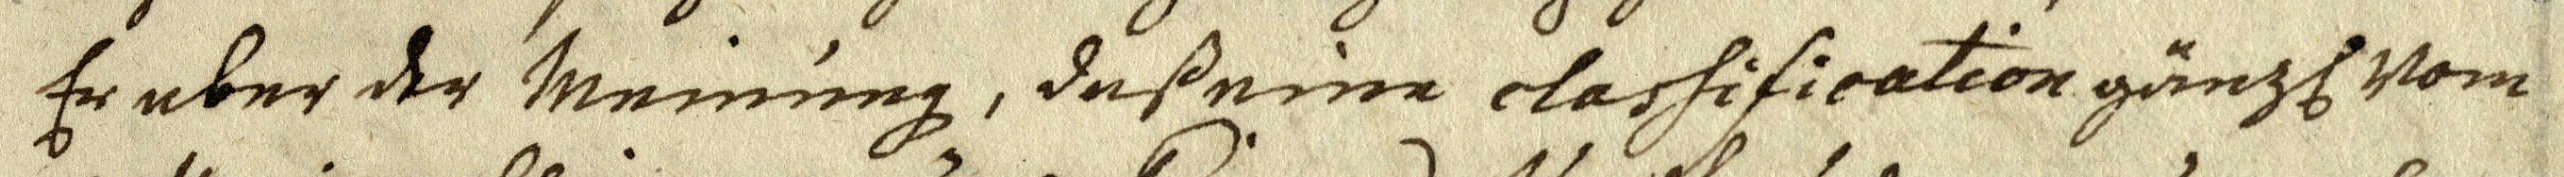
Er aber der Meinung, daß eine classification gänzl vom
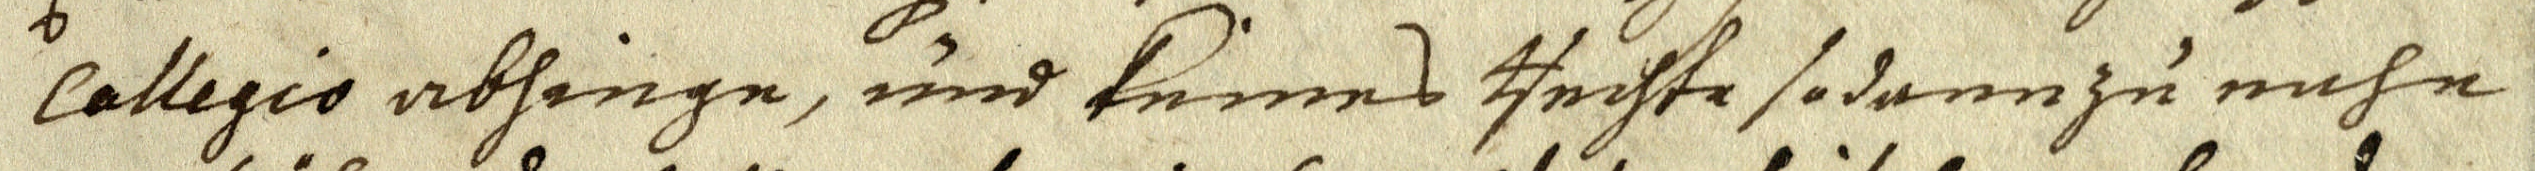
Collegio abhinge, und keines Rechte sodann zu nahe
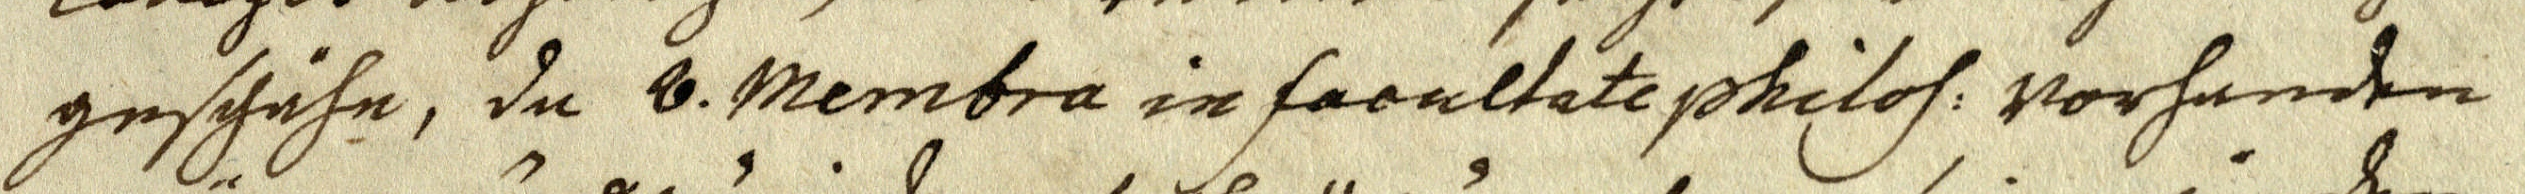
geschähe, da 8. Membra in facultate philos. vorhanden
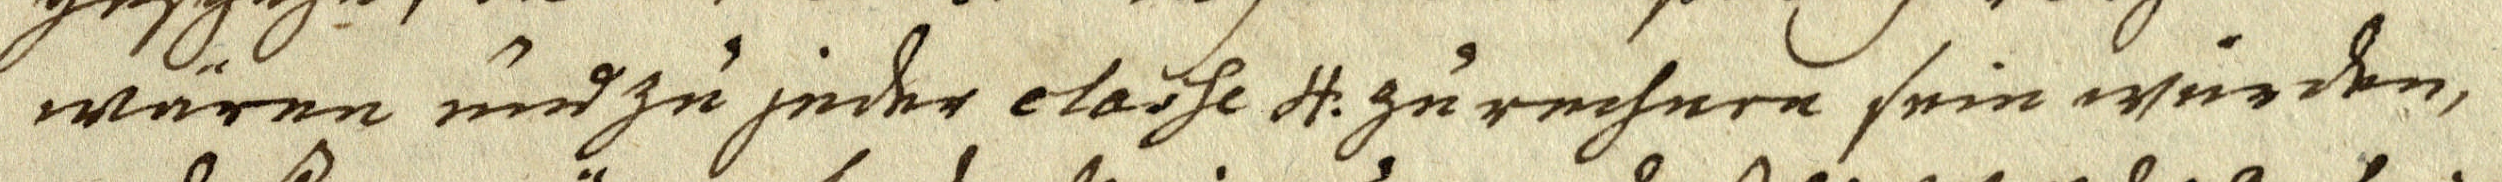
wären und zu jeder classe 4. zu rechnen sein würden,
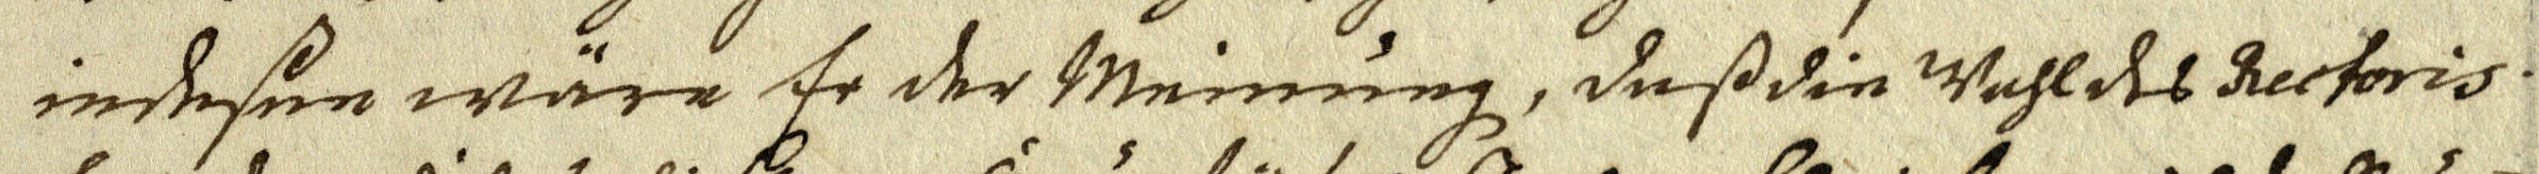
indeßen wäre Er der Meinung, daß die Wahl des Rectoris
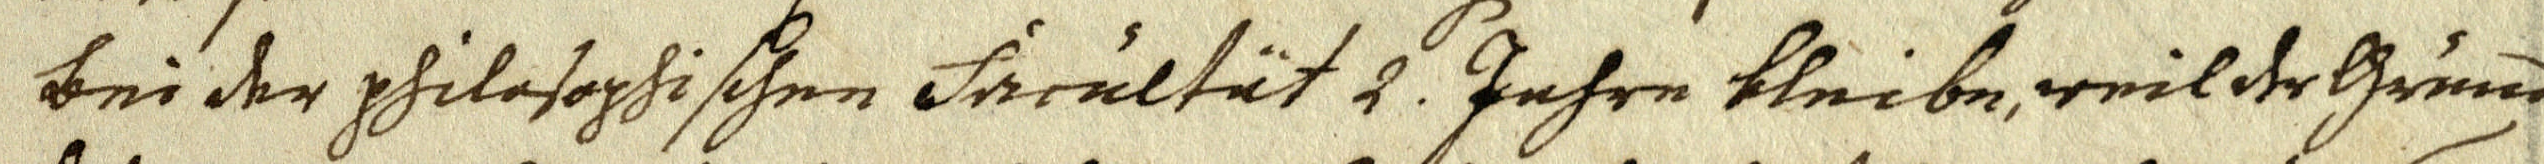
bei der philosophischen facultät 2. Jahre bleibe, weil der Grund
